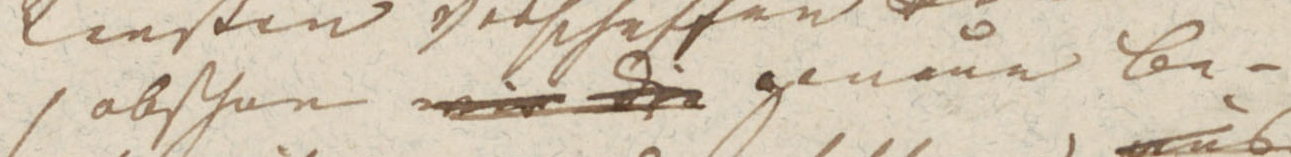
(obschon wir die genaue Be-
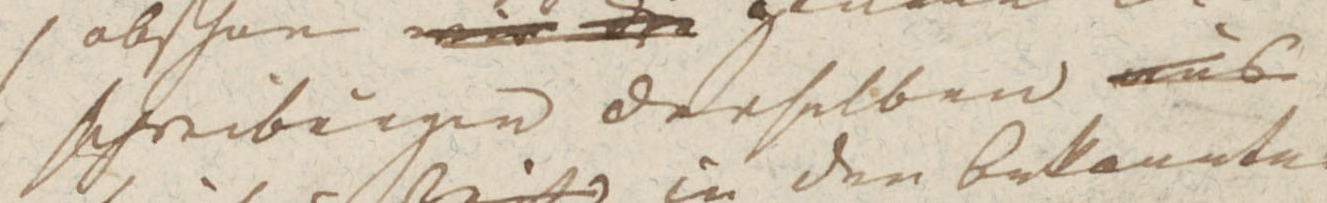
schreibungen derselben aus
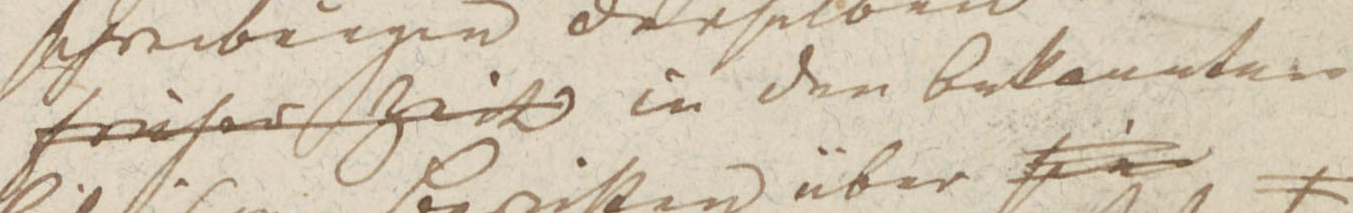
früher Zeit in den bekannten
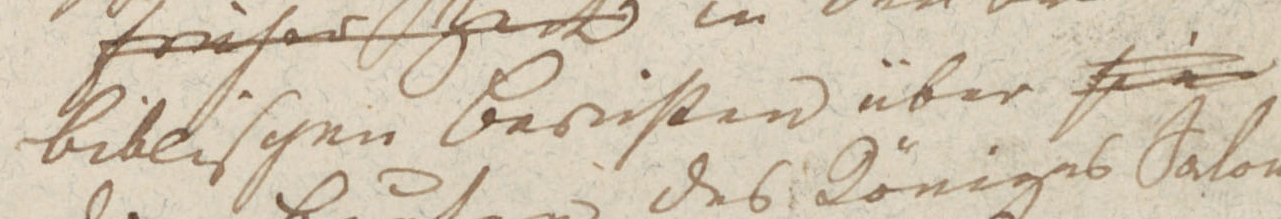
biblischen Berichten über sie
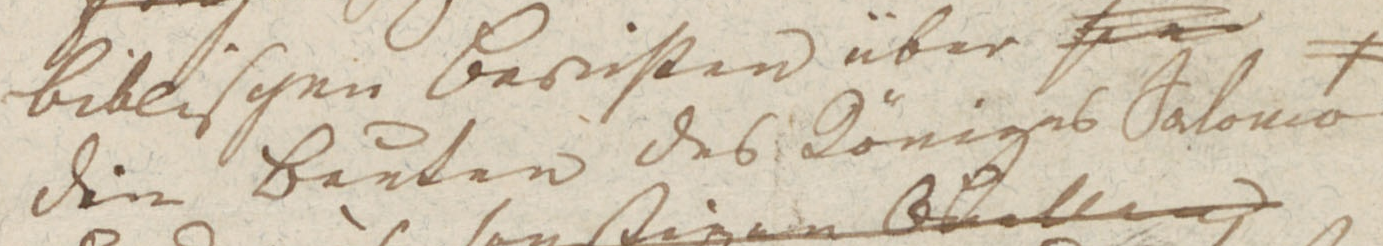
die Bauten des Königes Salomo %
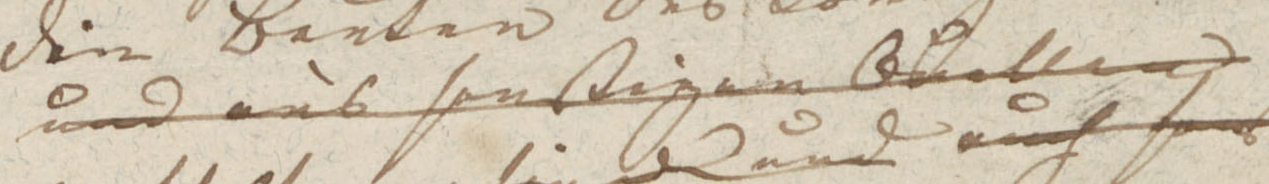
und aus sonstigen Quellen
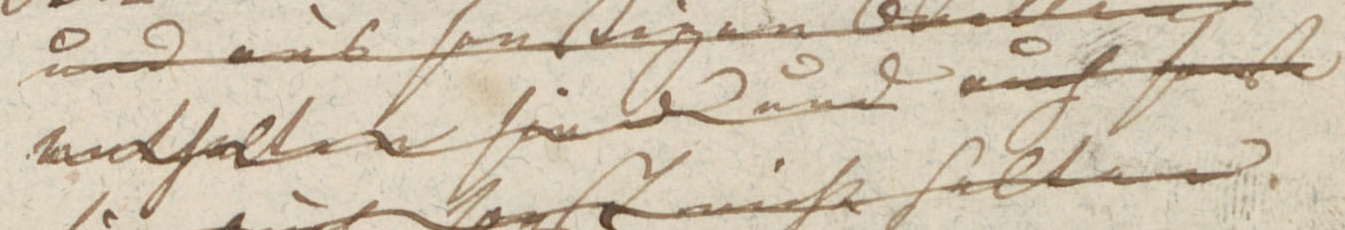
enthalten sind und auch sonst
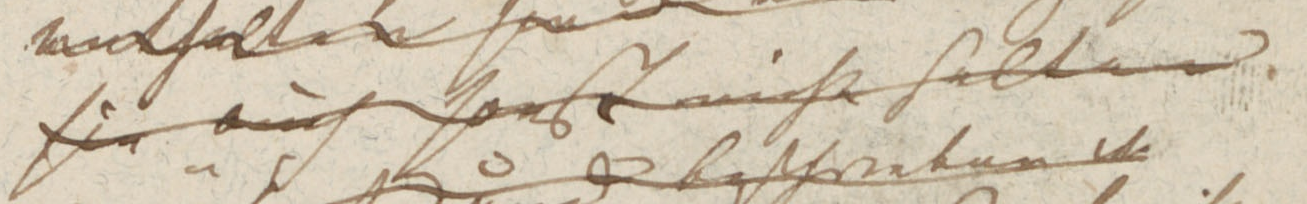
sie auch sonst nicht selten
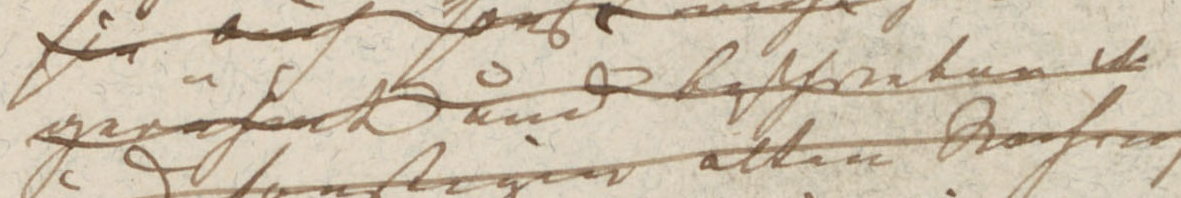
gerühmt und beschrieben w
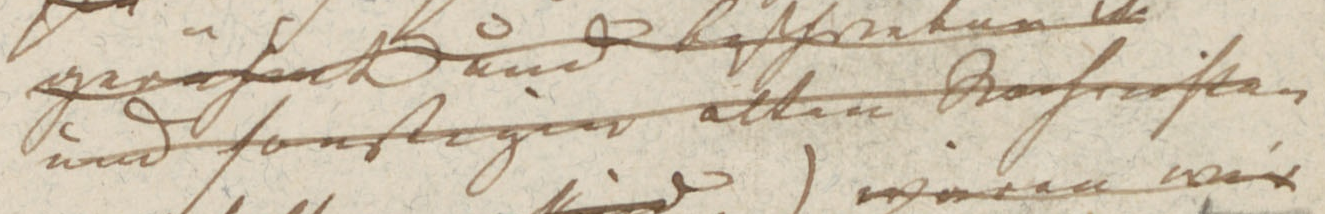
und sonstigen alten Nachrichten
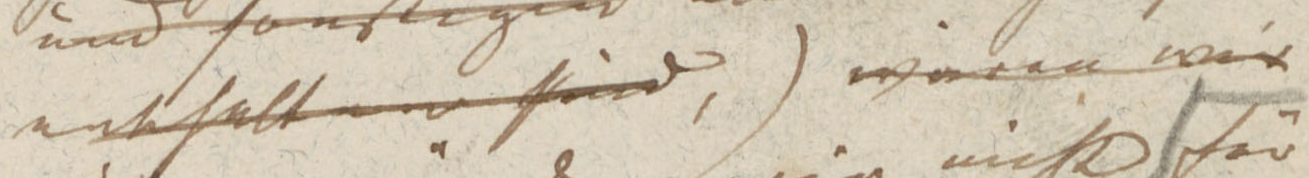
enthalten sind,) wären wir
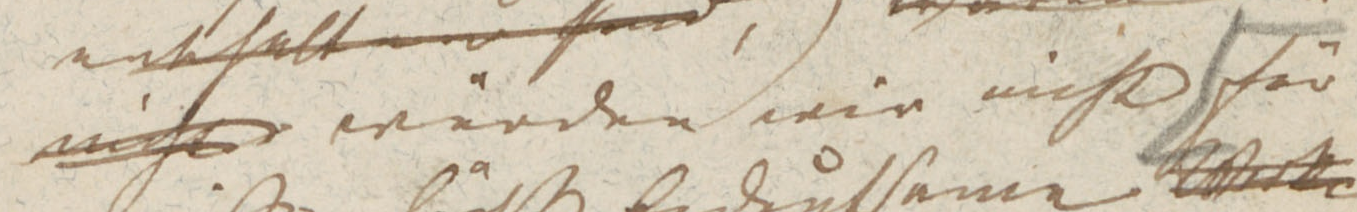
nicht würden wir nicht % für
